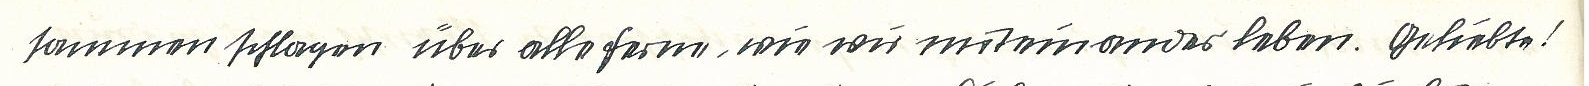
sammen schlagen über alle Ferne, wie wir miteinander leben. Geliebte!
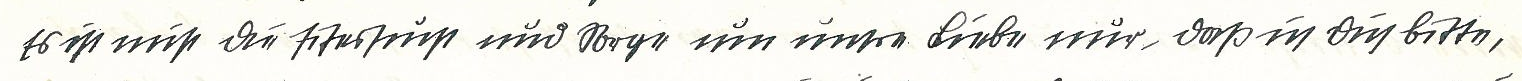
Es ist nicht die Eifersucht und Sorge um unsere Liebe nur, daß ich Dich bitte,
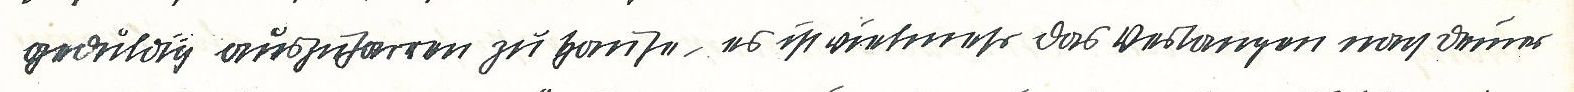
geduldig auszuharren zu Hause, es ist vielmehr das Verlangen nach Deiner
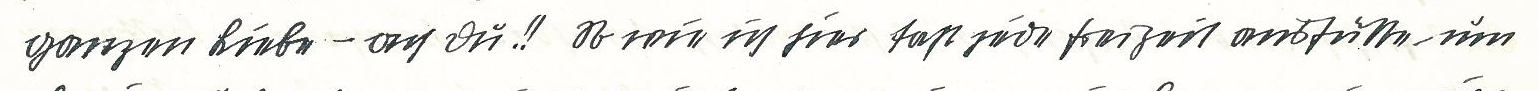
ganzen Liebe – ach Du!! So wie ich hier fast jede Freizeit ausfülle um
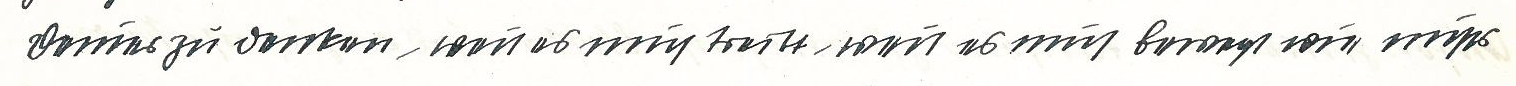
Deiner zu denken, weil es mich treibt, weil es mich bewegt wie nichts
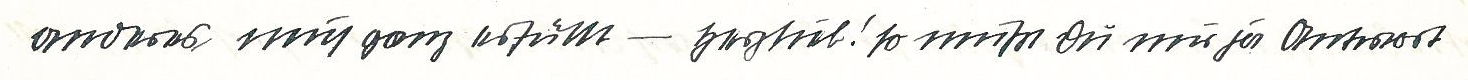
anderes, mich ganz erfüllt – Herzlieb! So mußt Du mir ja Antwort
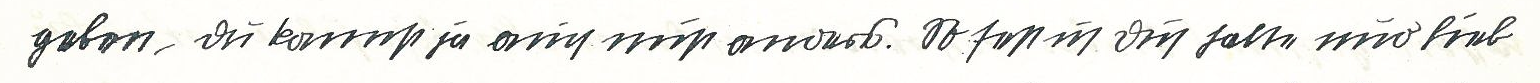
geben, Du kannst ja auch nicht anders. So fest ich Dich halte und lieb
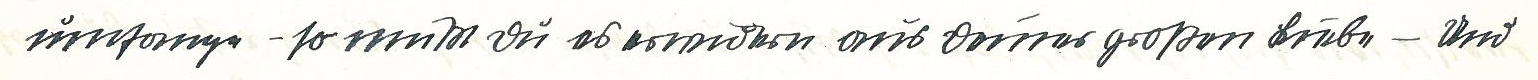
umfange – so mußt Du es erwidern aus Deiner großen Liebe – Und
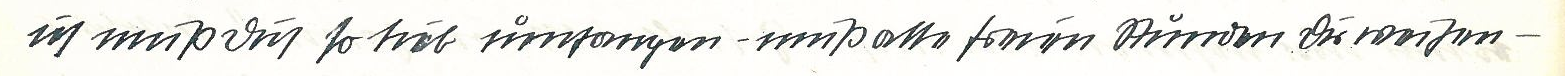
ich muß Dich so lieb umfangen – muß alle freien Stunden Dir weihen –
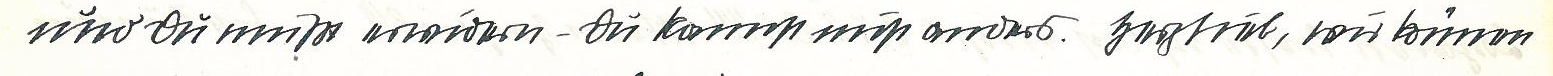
und Du mußt erwidern – Du kannst nicht anders. Herzlieb, wir können
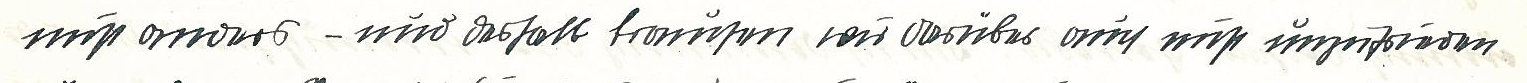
nicht anders – und deshalb brauchen wir darüber auch nicht unzufrieden
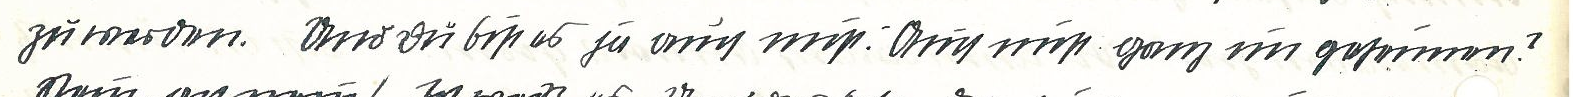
zu werden. Und Du bist es ja auch nicht. Auch nicht ganz im geheimen?
